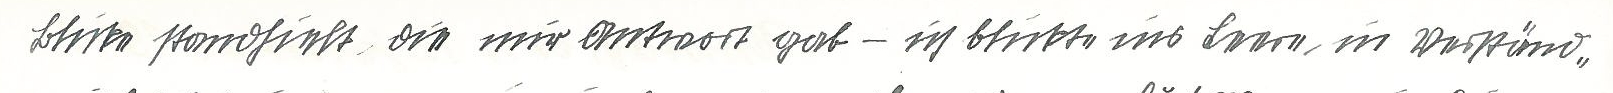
Blicke standhielt, die mir Antwort gab – ich blickte ins Leere, in Verständ¬
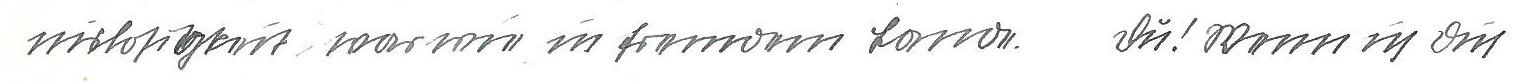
nislosigkeit, war wie im fremden Lande. Du! Wenn ich Dich
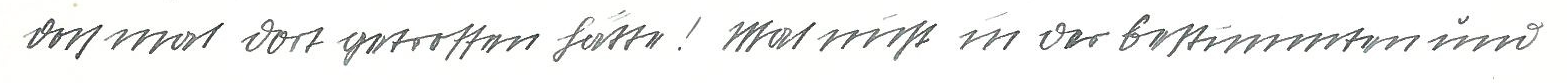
doch mal dort getroffen hätte! Mal wirst in der bestimmten und
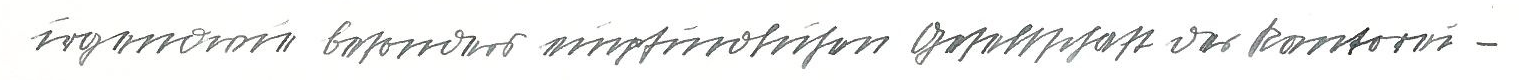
irgendwie besonders empfindlichen Gesellschaft der Kantorei –
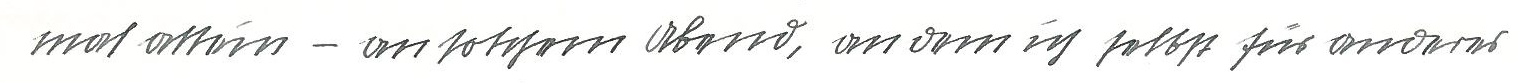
mal allein – an solchem Abend, an dem ich selbst für anderes
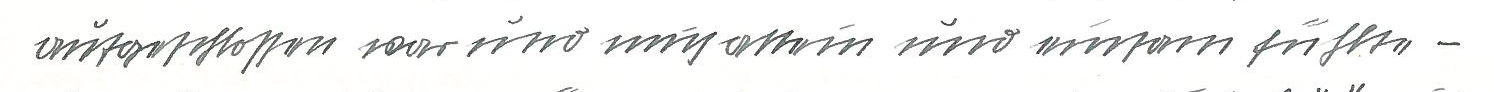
aufgeschlossen war und mich allein und einsam fühlte –
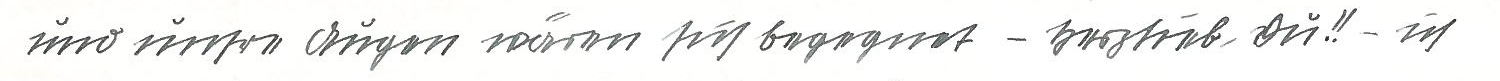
und unsre Augen wären sich begegnet – Herzlieb, Du!! – ich
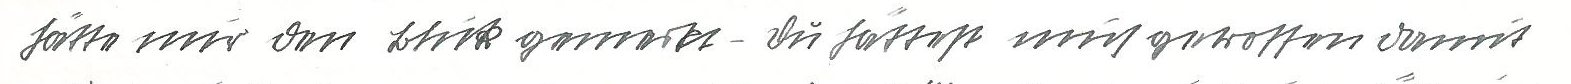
hätte mir den Blick gemerkt – Du hättest mich getroffen damit
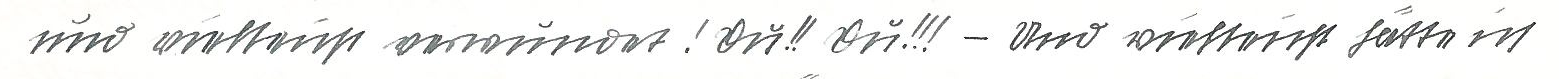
und vielleicht verwundet! Du!! Du!!! – Und vielleicht hätte ich
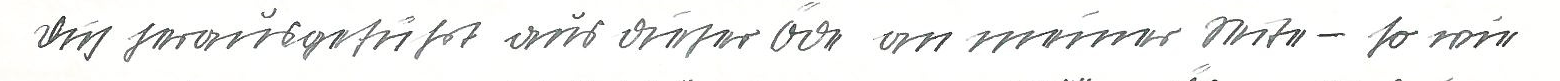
Dich herausgeführt aus dieser Öde an meiner Seite – so wie
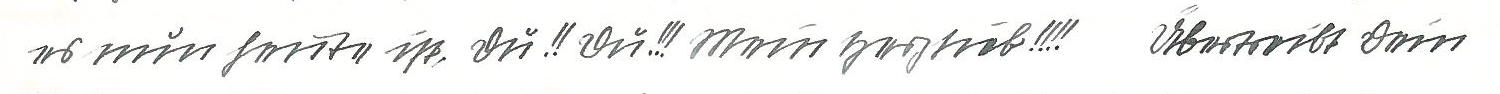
es nun heute ist, Du!! Du!!! Mein Herzlieb!!!! Übertreibt Dein
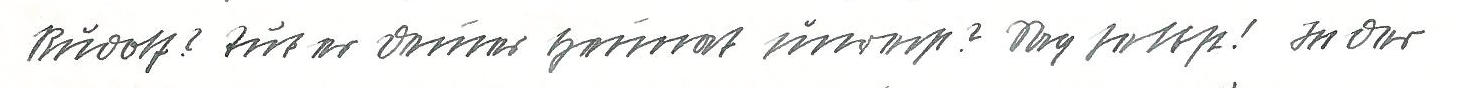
Roland? Tut er Deiner Heimat unrecht? Sag selbst! In der
